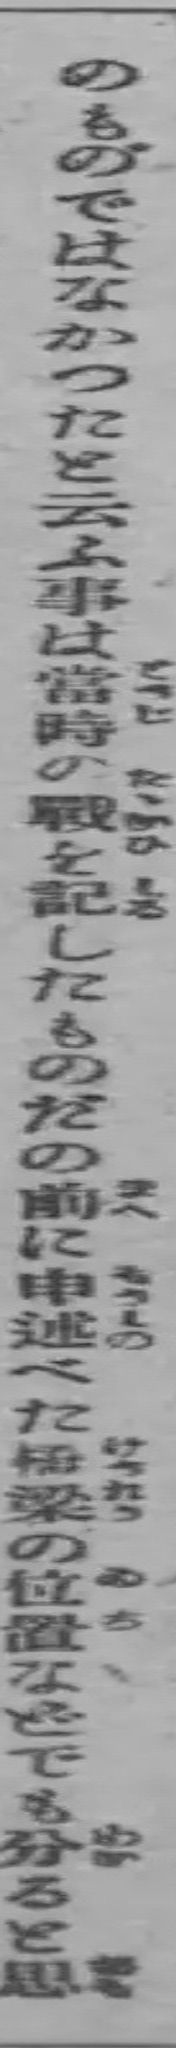のものではなかつたと云ふ事は当時の戦を記したものだの前に申述べた橋梁の位置などでも分ると思
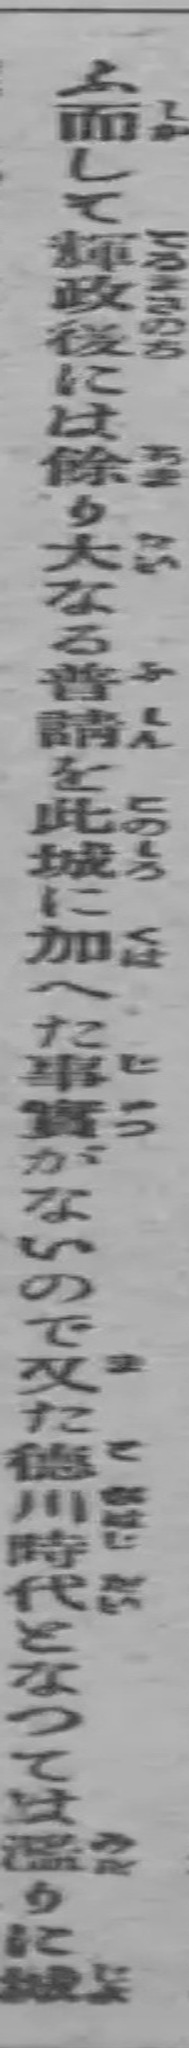ふ而して輝政後には余り大なる普請を此城に加へた事実がないので又た徳川時代となつては濫りに城
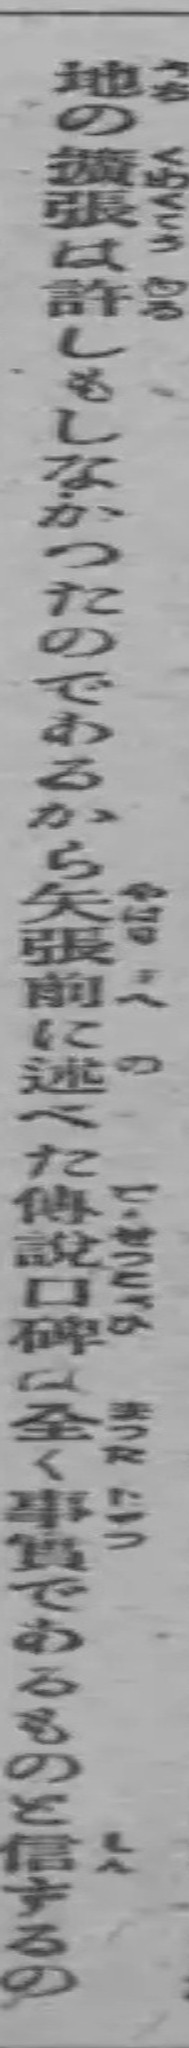地の拡張は許しもしなかつたのであるから矢張前に述べた伝説口碑は全く事実であるものと信ずるの
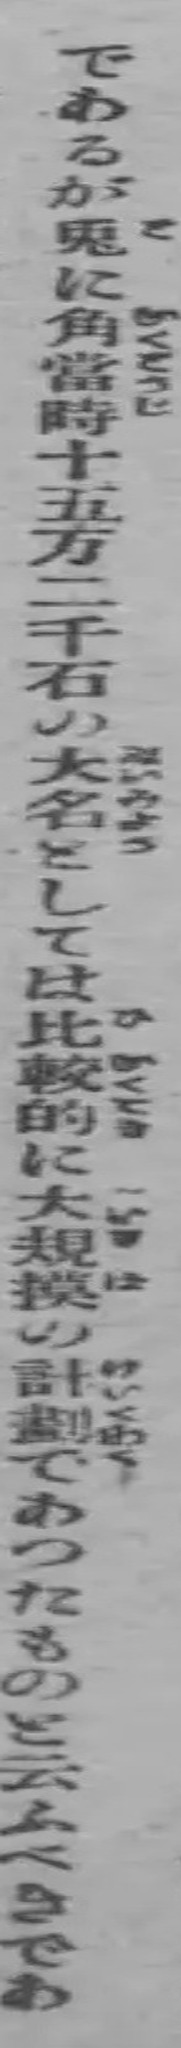柳生門であるが兎に角当時十五万二千石の大名としては比較的に大規模の計画であつたものと云ふべきであ
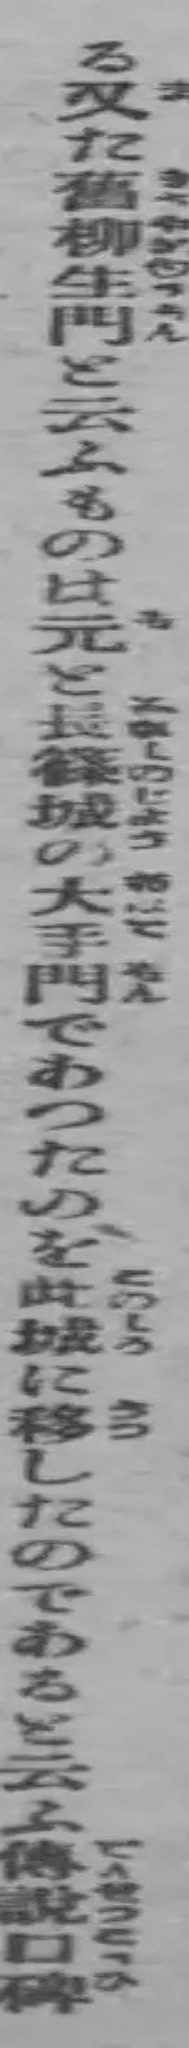る又た旧柳生門と云ふものは元と長篠城の大手門であつたのを此城に移したのであると云ふ伝説口碑
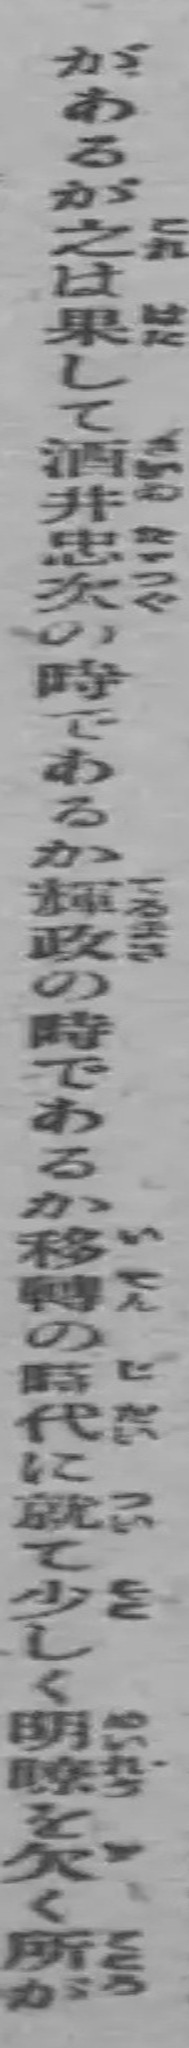があるが之は果して酒井忠次の時であるか輝政の時であるか移転の時代に就て少しく明瞭を欠く所が
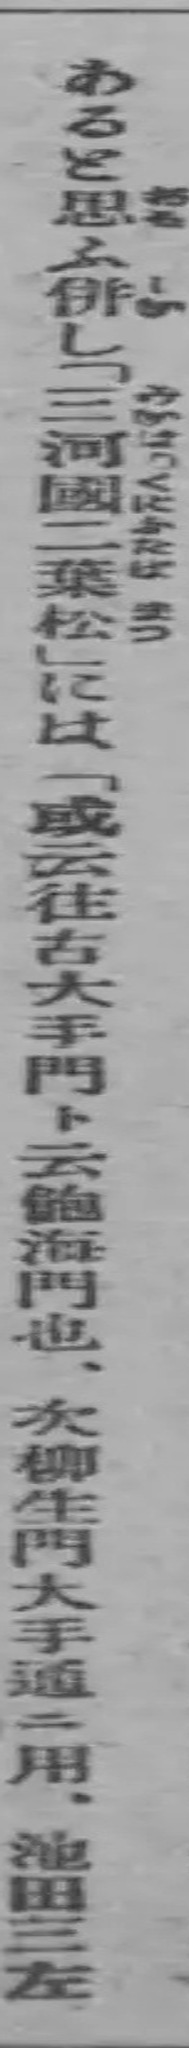あると思ふ併し「三河国二葉松」には「或云往古大手門ト云飽海門也、次柳生門大手通ニ用、池田三左
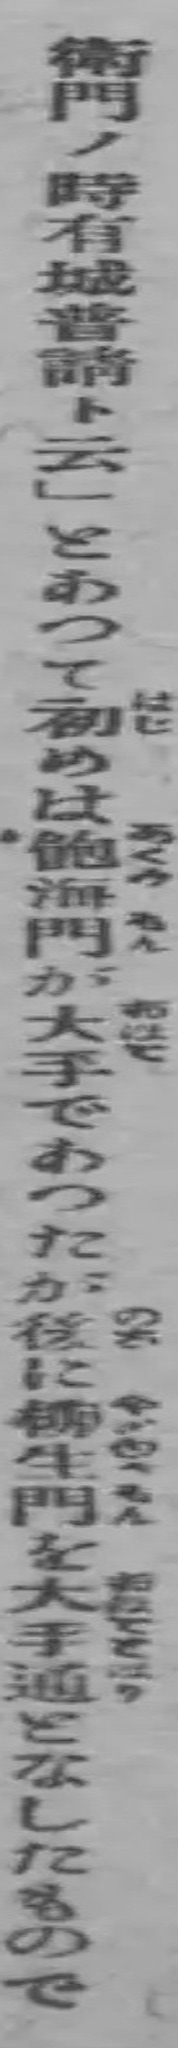衛門ノ時有城普請ト云」とあつて初めは飽海門が大手であつたが後に柳生門を大手通となしたもので
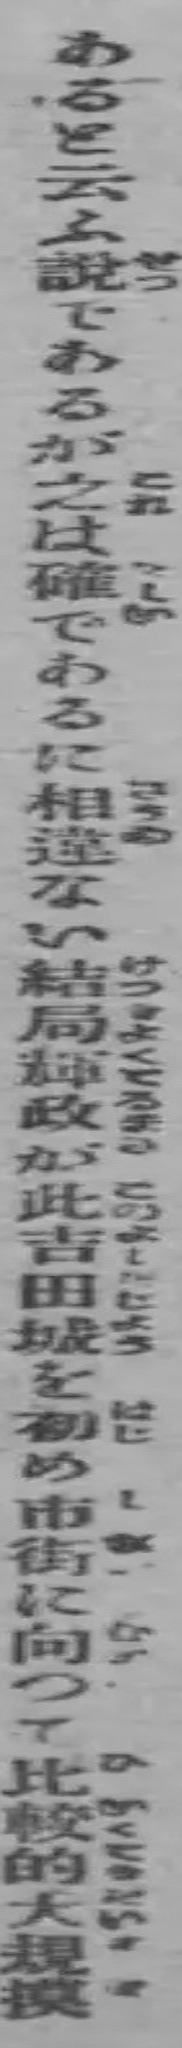あると云ふ説であるが之は確であるに相違ない結局輝政が此吉田城を初め市街に向つて比較的大規模
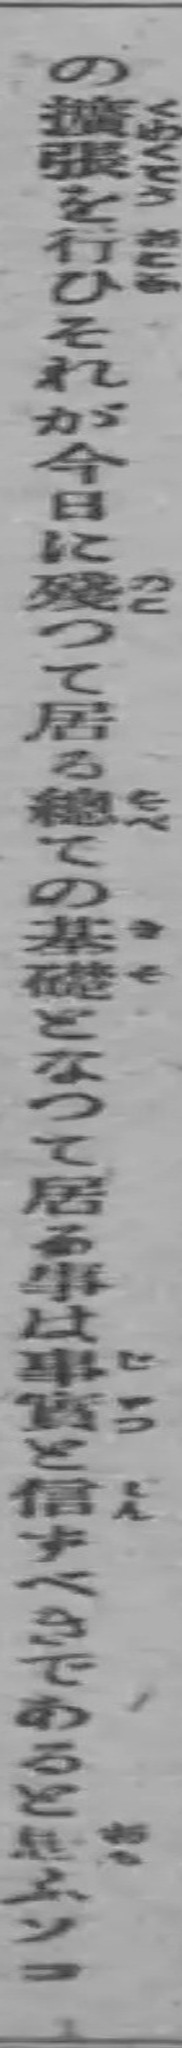の拡張を行ひそれが今日に残つて居る総て基礎となつて居る事は事実と信ずべきであると思ふソコ
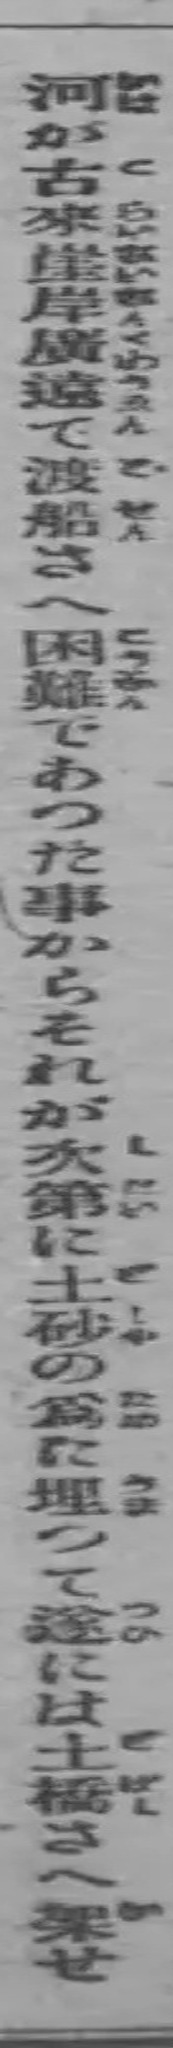河が古来崖岸広遠で渡船さへ困難であつた事からそれが次第に土砂の為に埋つて遂には土橋さへ架せ
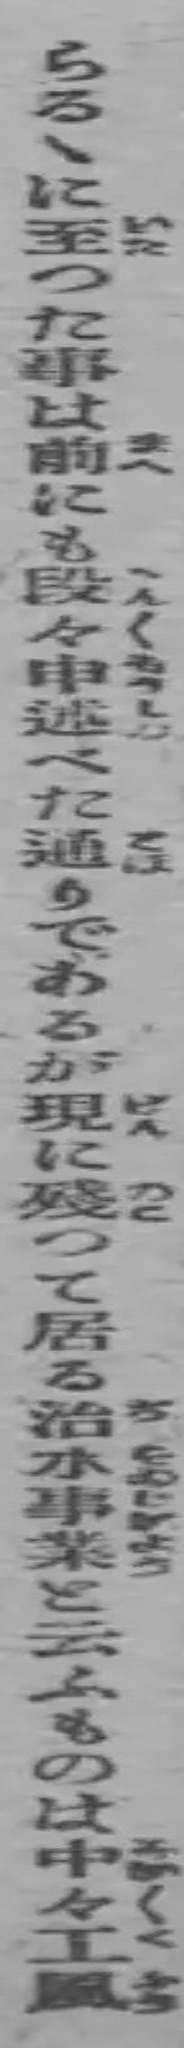らるゝに至つた事は前にも段々申述べた通りであるが現に残つて居る治水事業と云ふものは中々工風
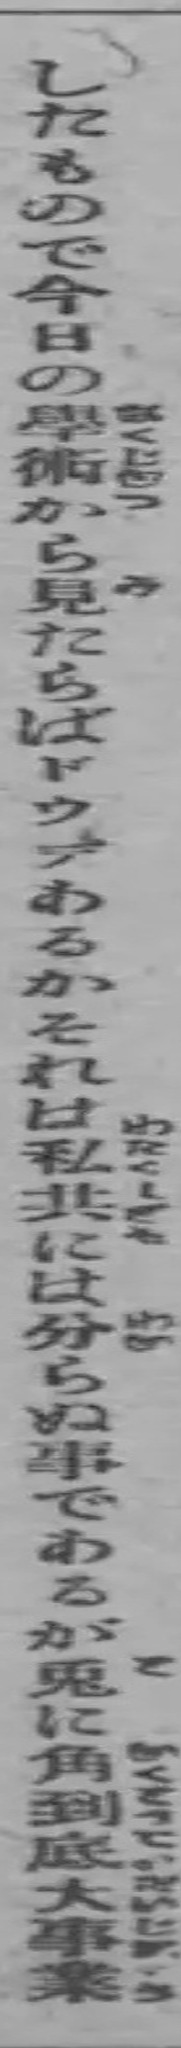したもので今日の学術から見たらばドウデあるかそれは私共には分らぬ事であるが兎に角到底大事業
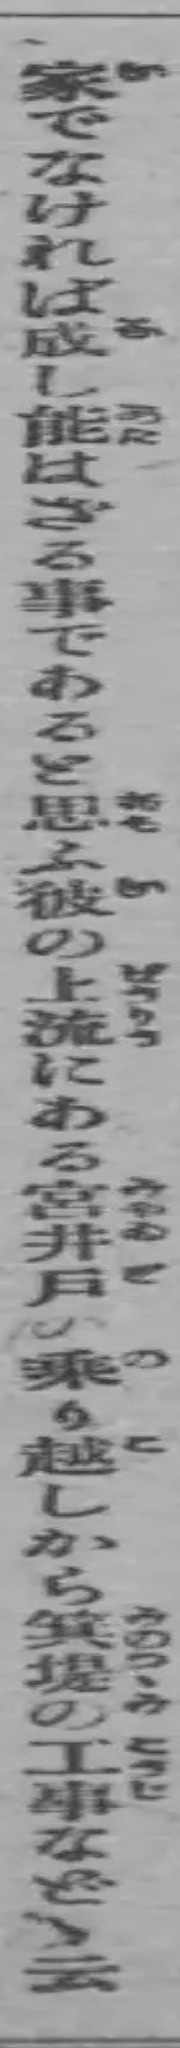家でなければ成し能はざる事であると思ふ彼の上流にある宮井戸の乗り越しから箕堤の工事などと云
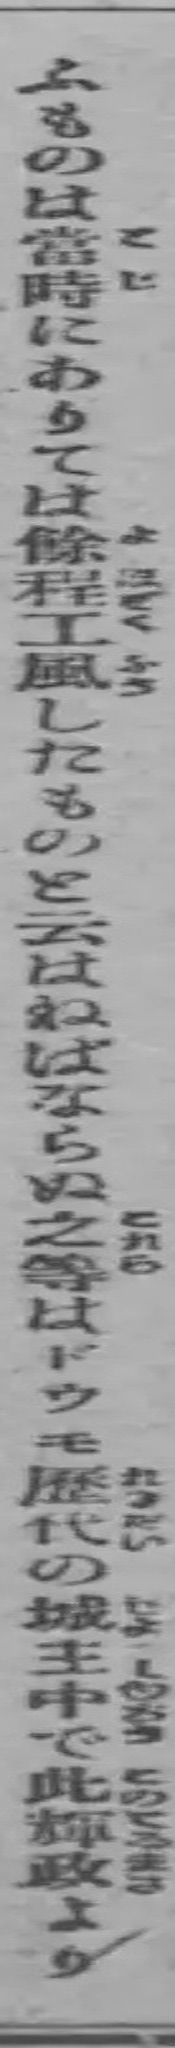ふものは当時にありては余程工風したものと云はねばならぬ之等はドウモ歴代の城主中で此輝政より
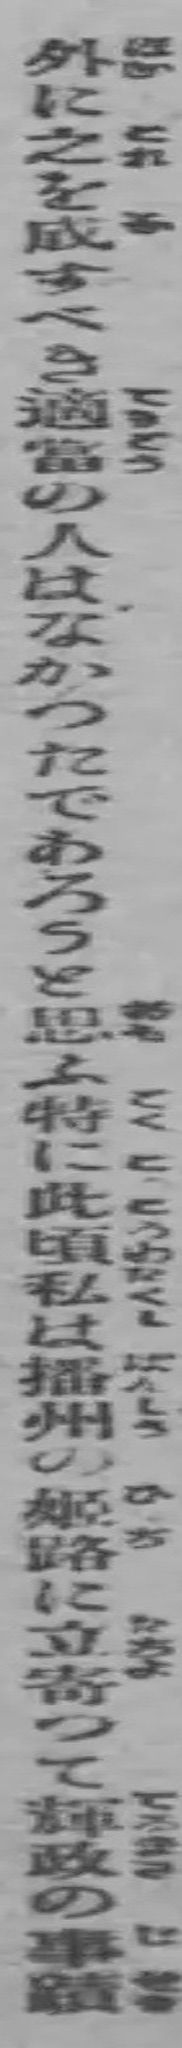外に之を成すべき適当の人はなかつたであろうと思ふ特に此頃私は播州の姫路に立寄つて輝政の事蹟
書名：豊橋市史談
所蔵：国立国会図書館 National Diet Library, JAPAN
